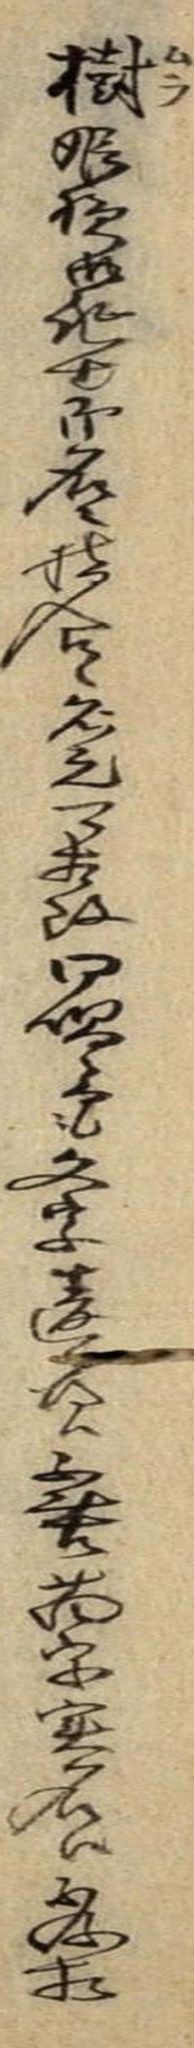樹姫様御誕生御名に指合候名元可相改同唱に而も文字違候得は不苦苗字実名は不及相
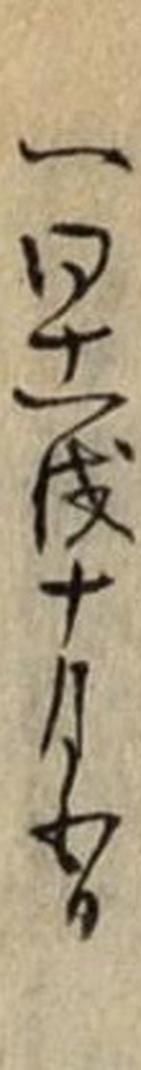一同十一戌十月五日
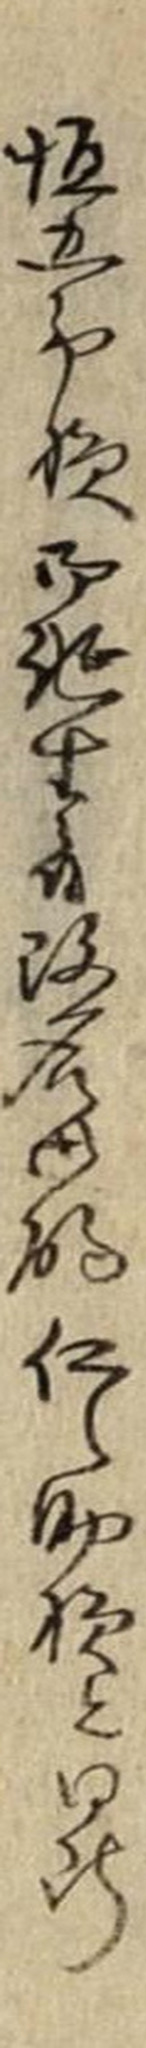恒五郎様御誕生に付改名御触仁之助様と同断
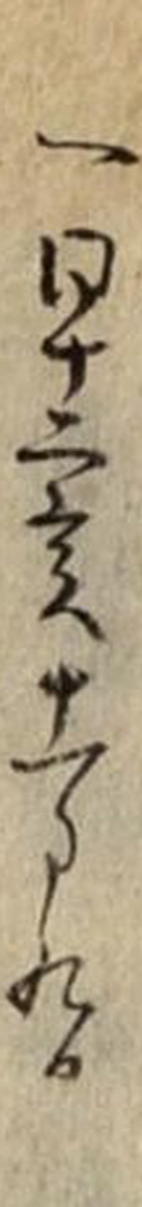一同十二亥十一月九日
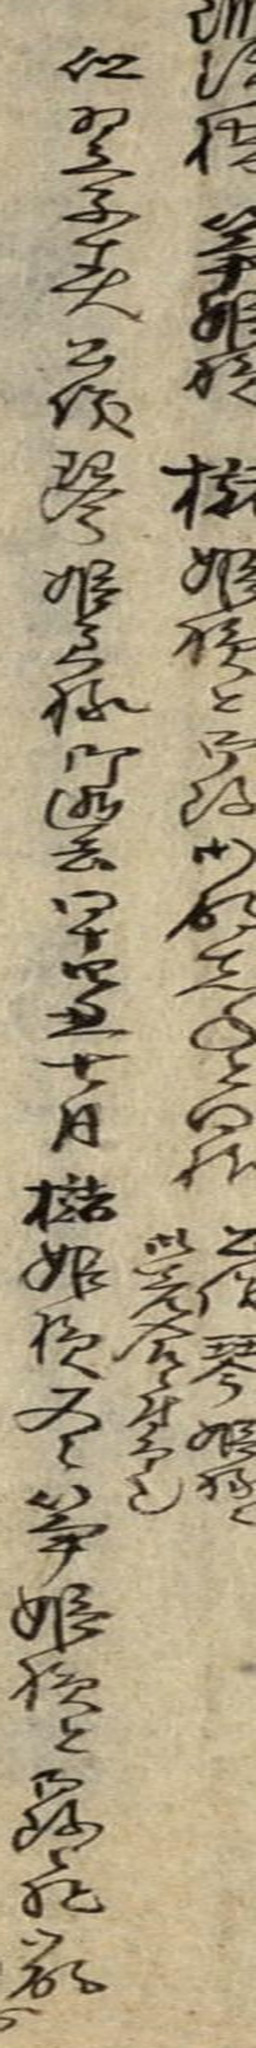但翌子春公儀琴姫君様御逝去同十四丑七月櫧姫様又々箏姫様と御改被遊御触同前
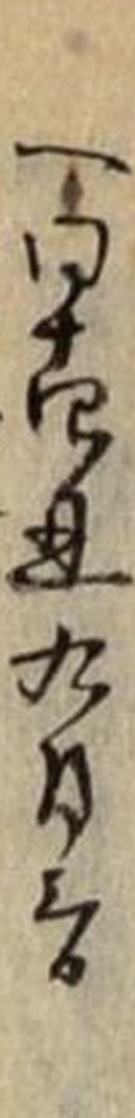一同十四丑九月三日
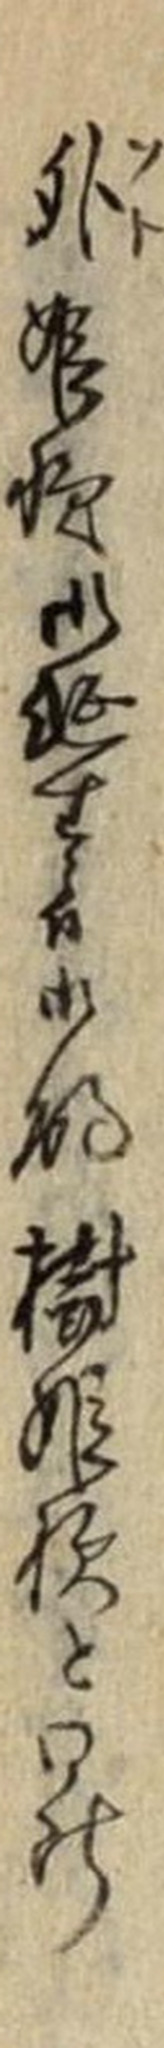外姫様御誕生に付御触樹姫様と同断
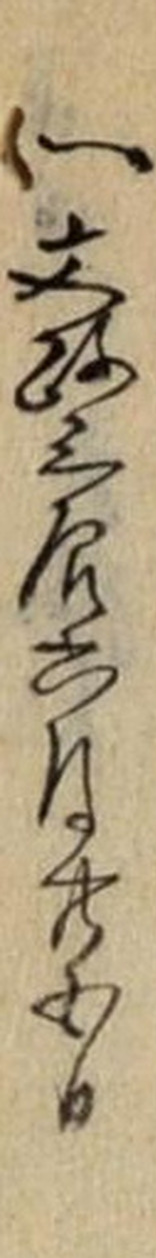一文政三辰六月廿五日
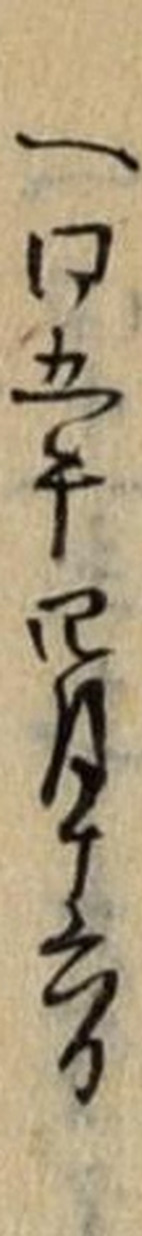一同五午四月十六日
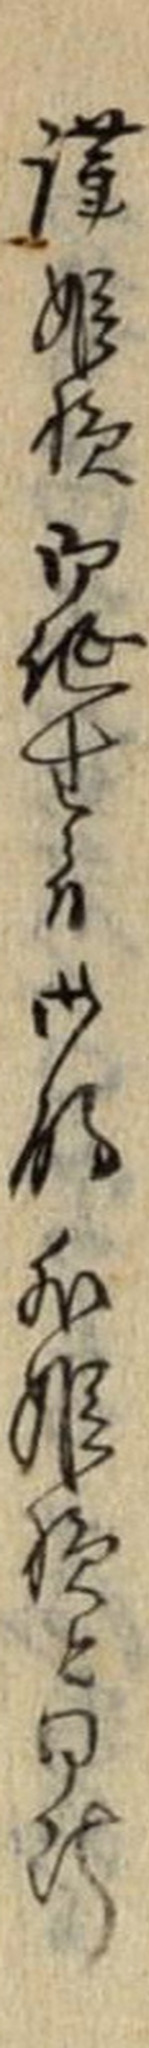謹姫様御誕生に付御触外姫様と同断
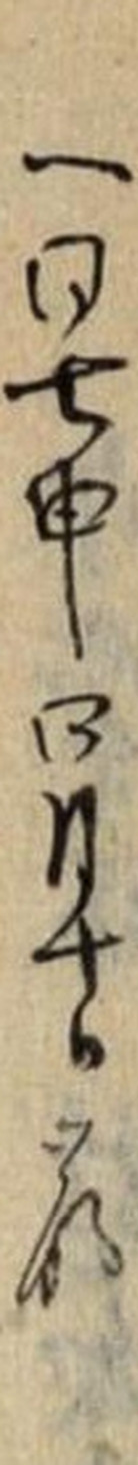一同七申四月十日御触
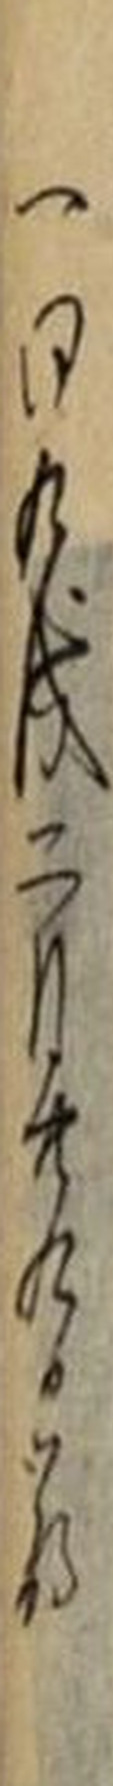一同九戌二月廿九日御触
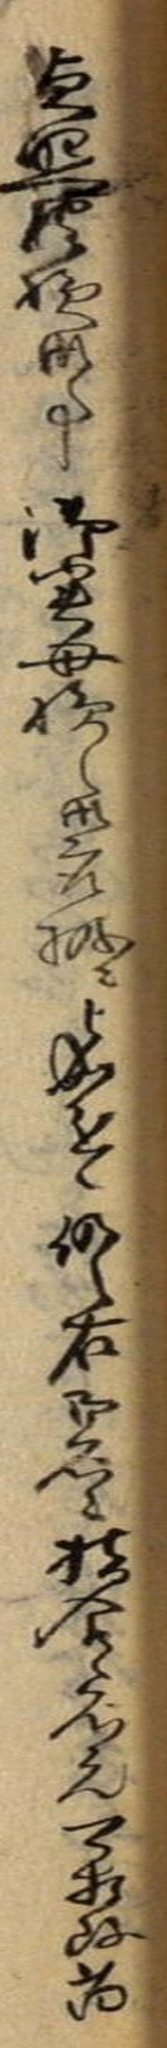貞照院様御事御実母様之御取扱に被成進候仍之右御名に指合候名元可相改苗
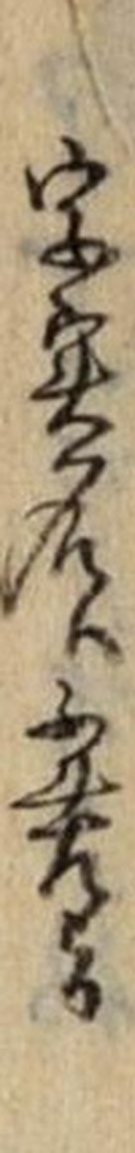字実名は不苦旨
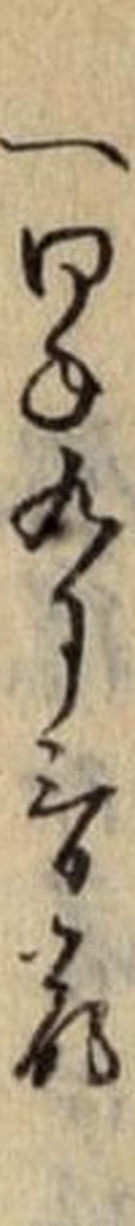一同年九月三日御触
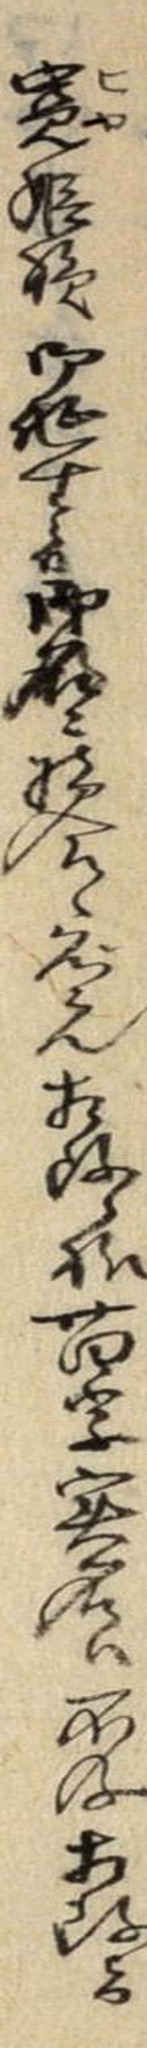寛姫様御誕生に付御名に指合候名元相改候様苗字実名は不及相改旨
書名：蒐輯之部
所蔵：福井県文書館 Fukui Prefectural Archives
